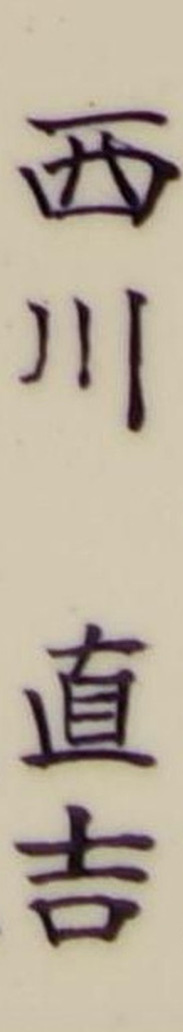西川直吉
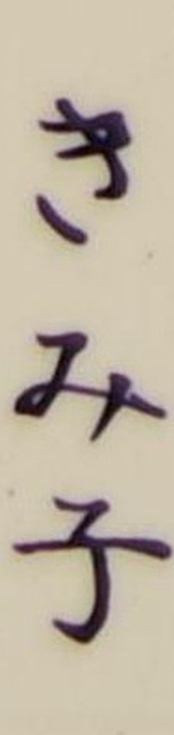きみ子
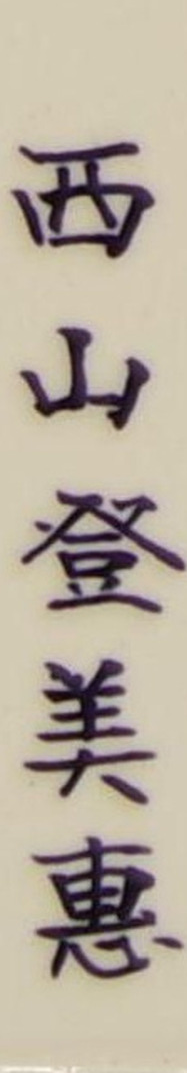西山登美恵
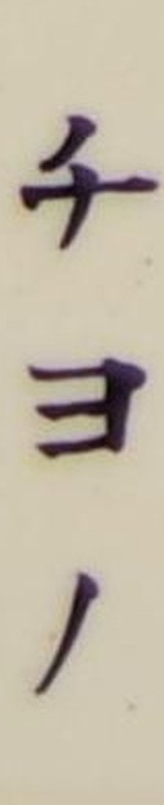チヨノ
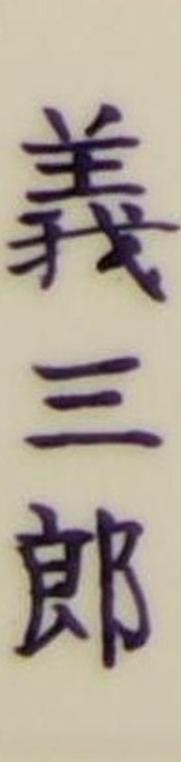義三郎
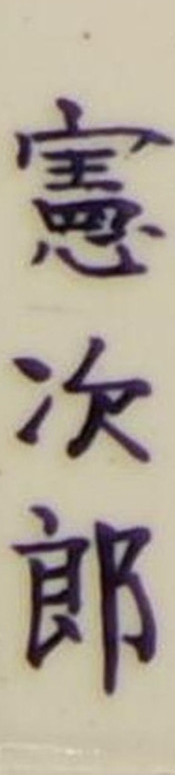憲次郎

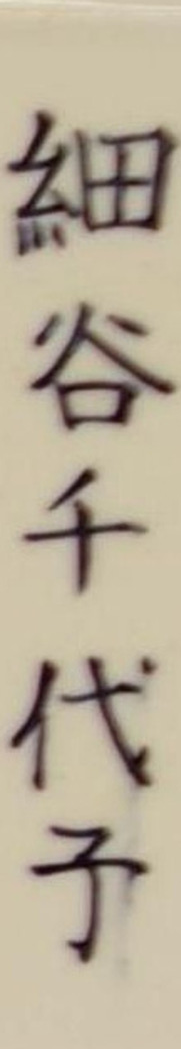細谷千代子
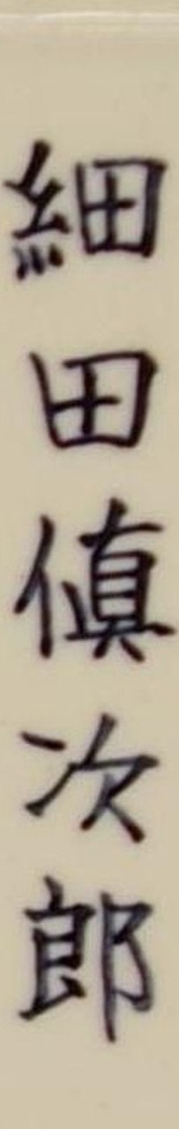細田慎次郎
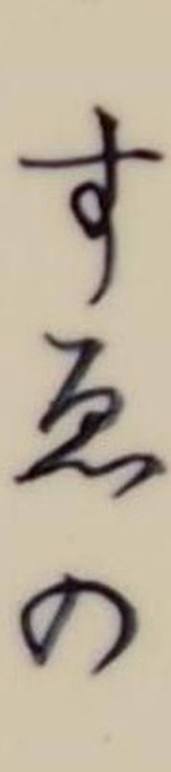すゑの
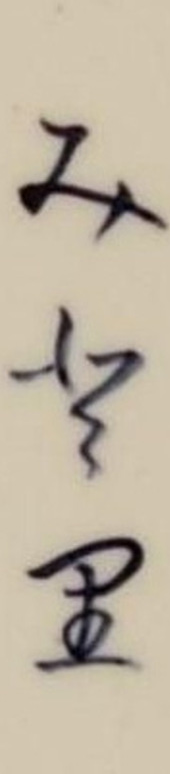みとり
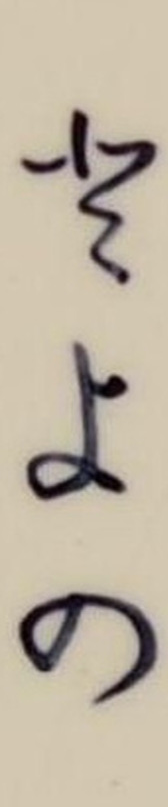とよの
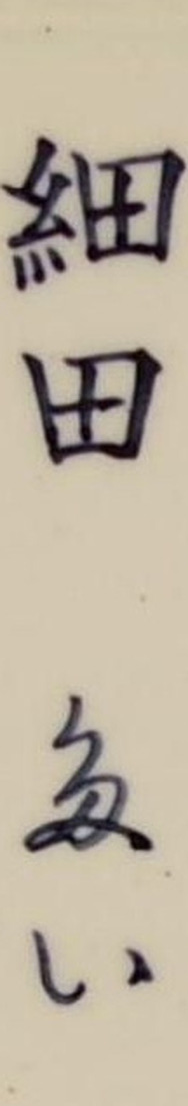細田たい
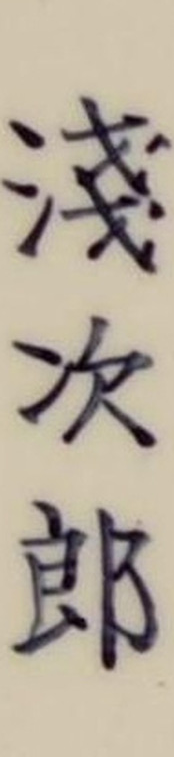浅次郎
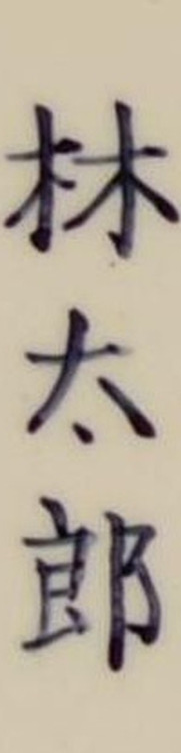林太郎
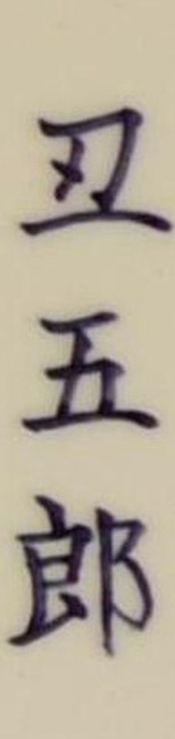丑五郎
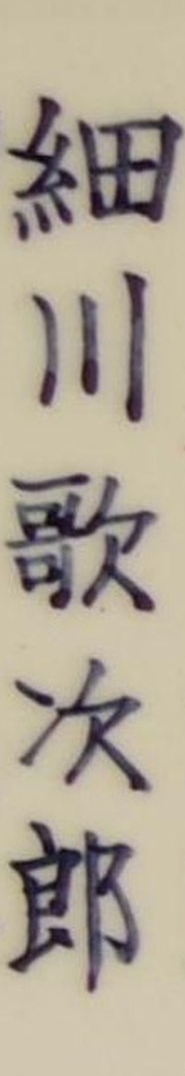細川歌次郎
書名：A~D
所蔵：koyasan kongobuji
